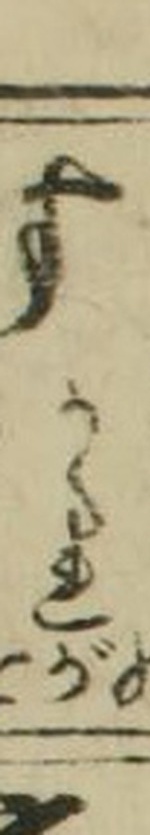かくれが
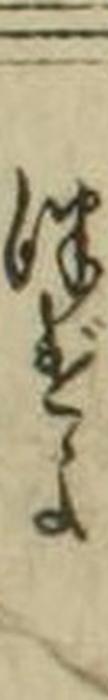つげよ
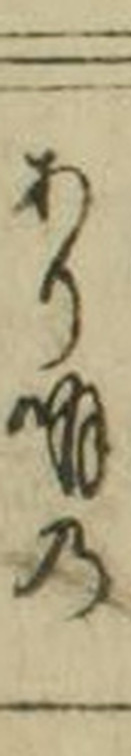あり明の
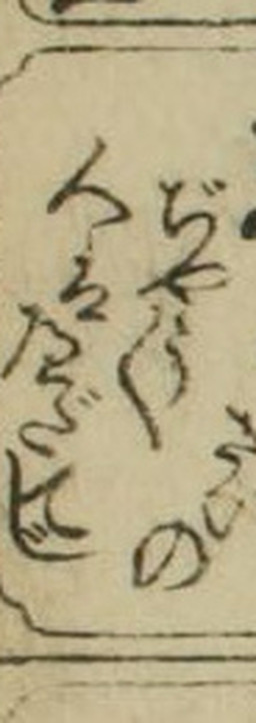人はへだてじ

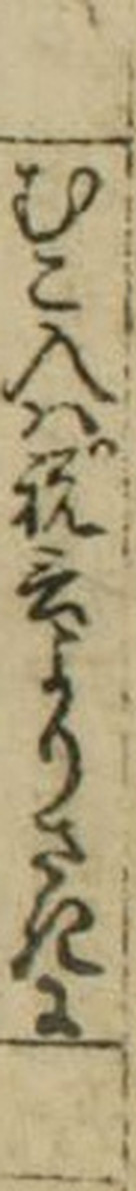むこ入は。祝言よりさきに
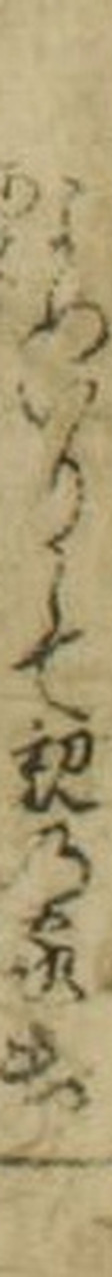よめいりして親の家出
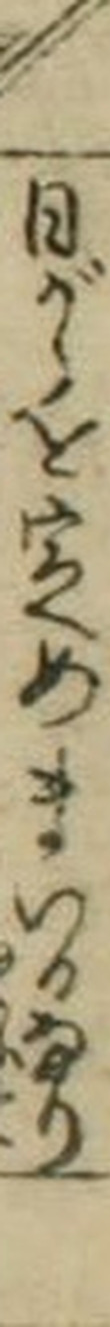日がらを定めまいるなり
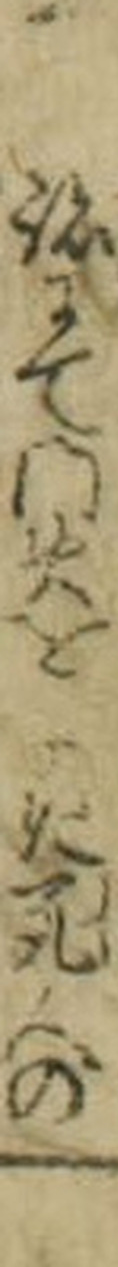跡にて門火を焚き死人の
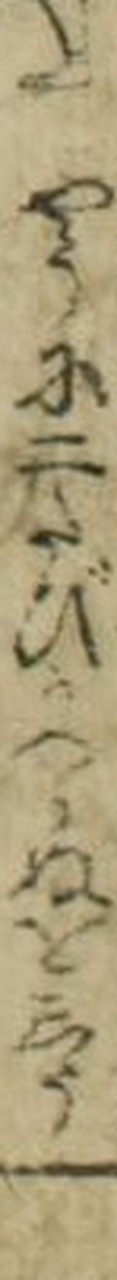やうに二たびかへらぬをしう
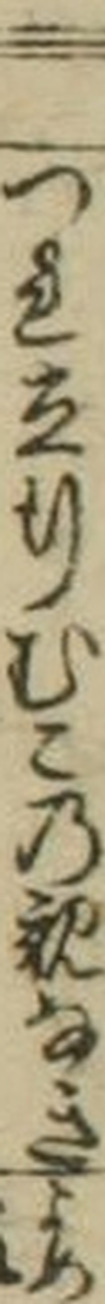つれ立行むこの親なき
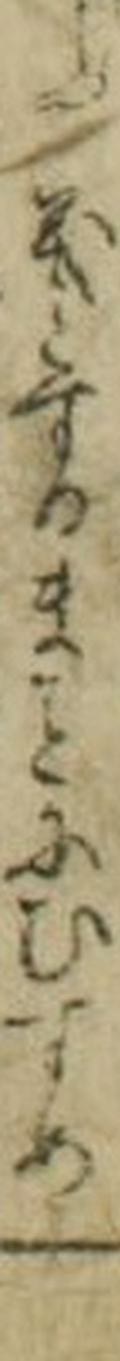義とするまことにむすめ
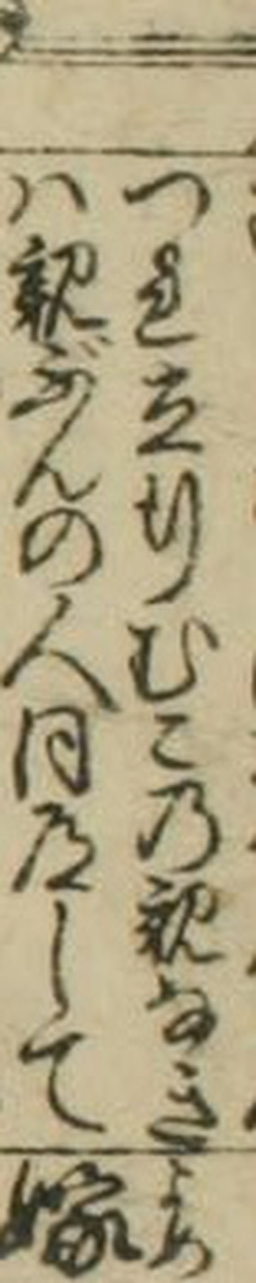は親ぶんの人同道して
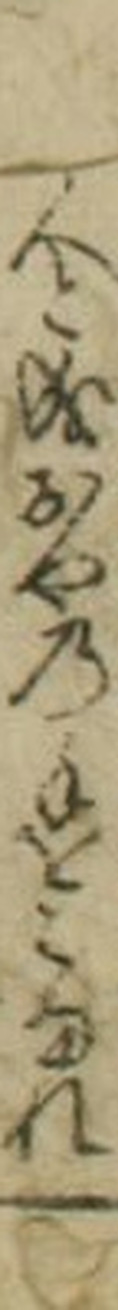人と成おやの手をはなれ
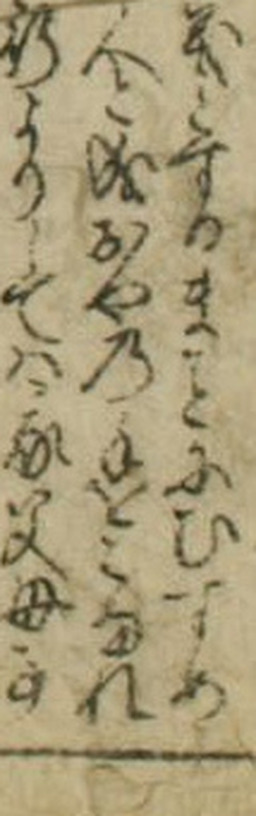人と成おやの手をはなれ
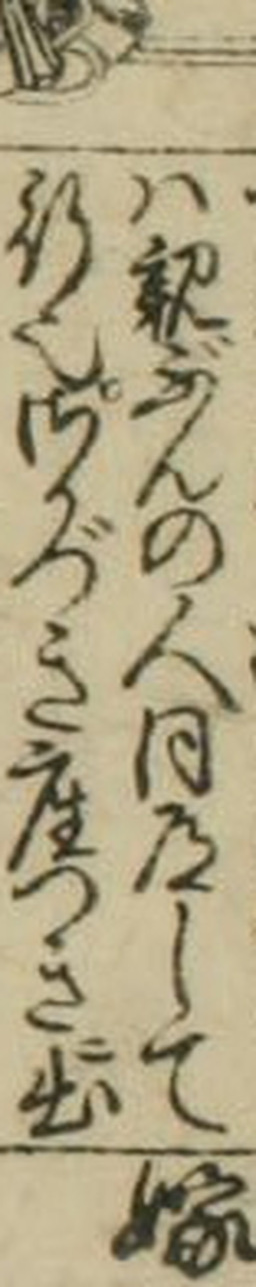行也。さかづき座つき二出
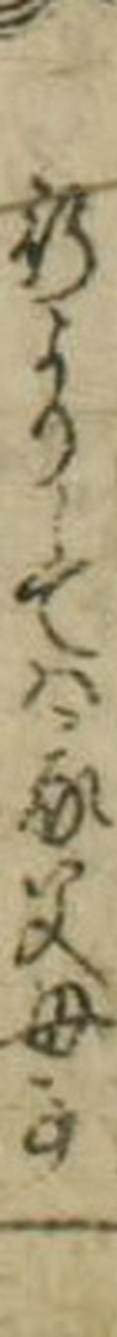行よりしては我父母事
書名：女源氏教訓鑑
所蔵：東京学芸大学附属図書館
